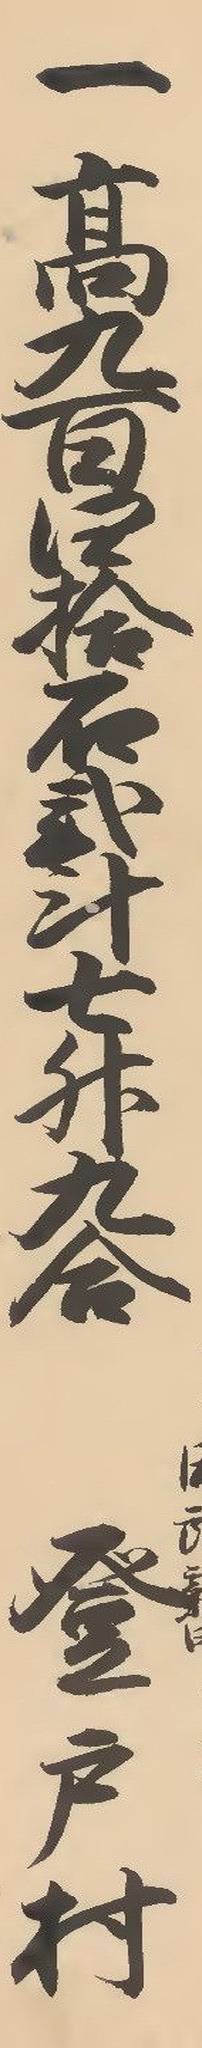一高九百四拾石弐斗七升九合登戸村

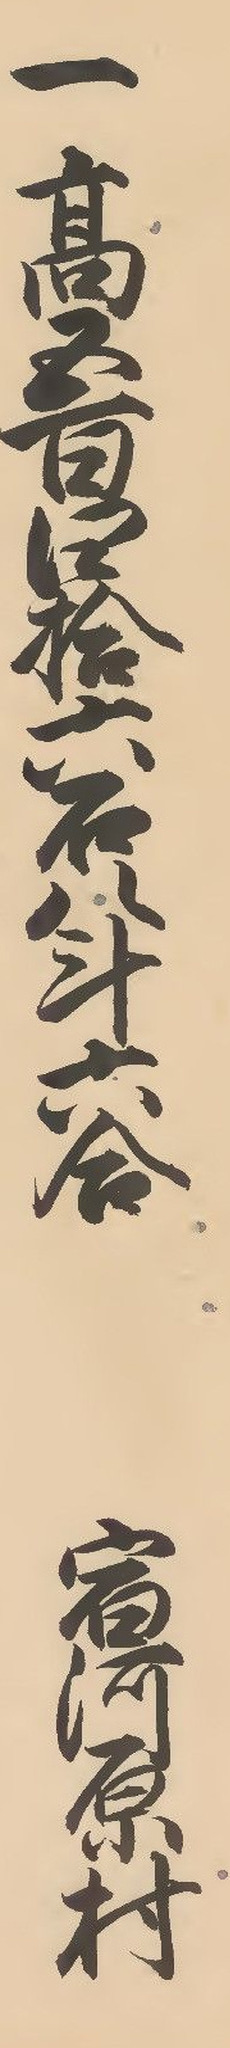一高五百四拾六石八斗六合宿河原村
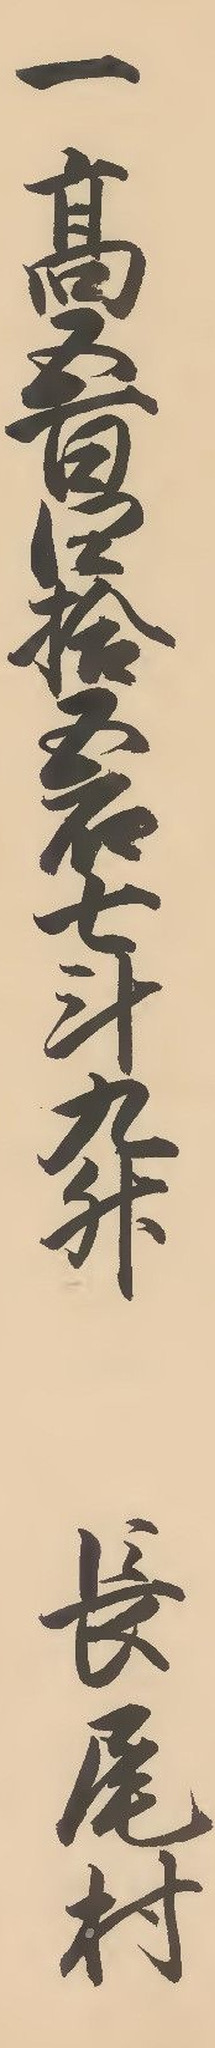一高五百四拾五石七斗九升長尾村
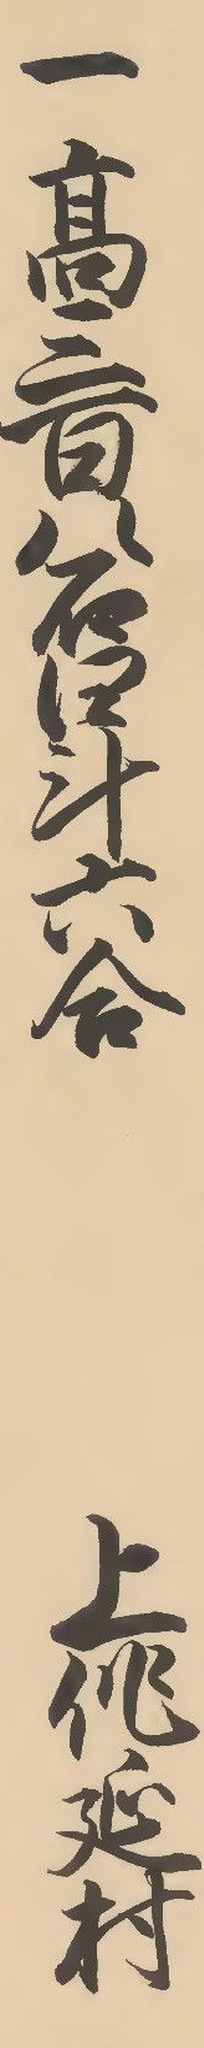一高三百八石四斗六合上作延村
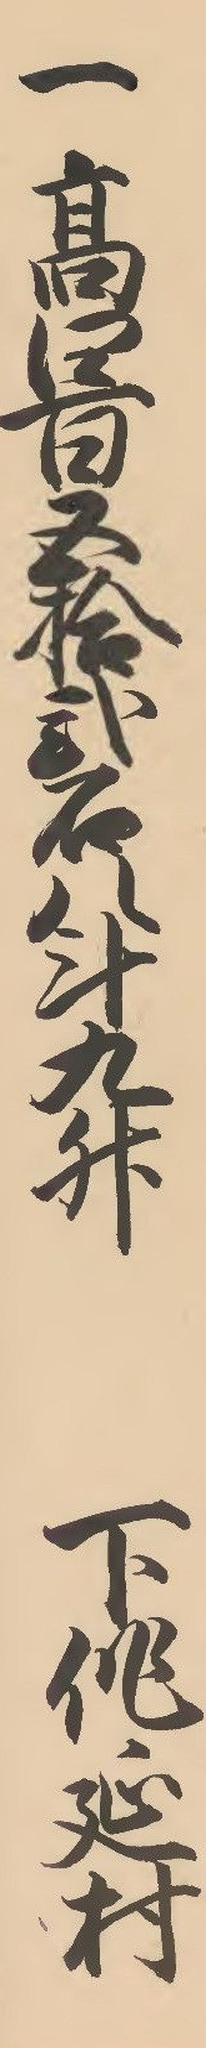一高四百五拾弐石八斗九升下作延村
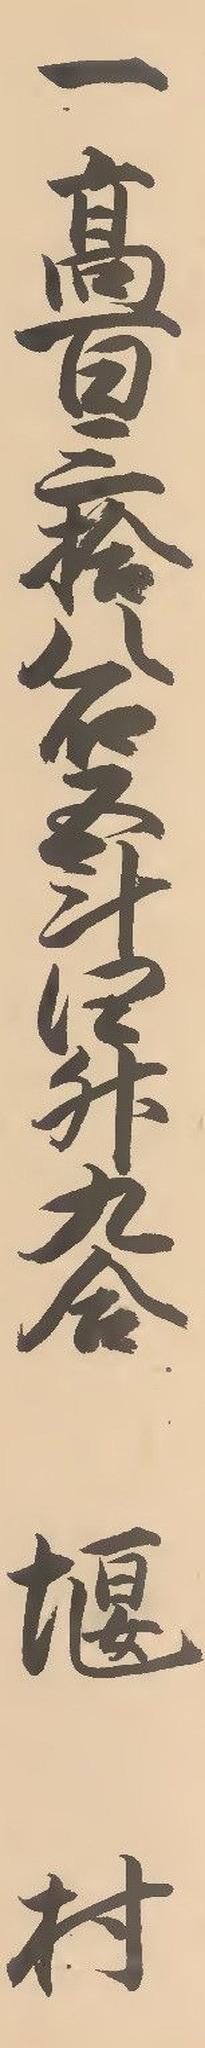一高百三拾八石五斗四升九合堰村
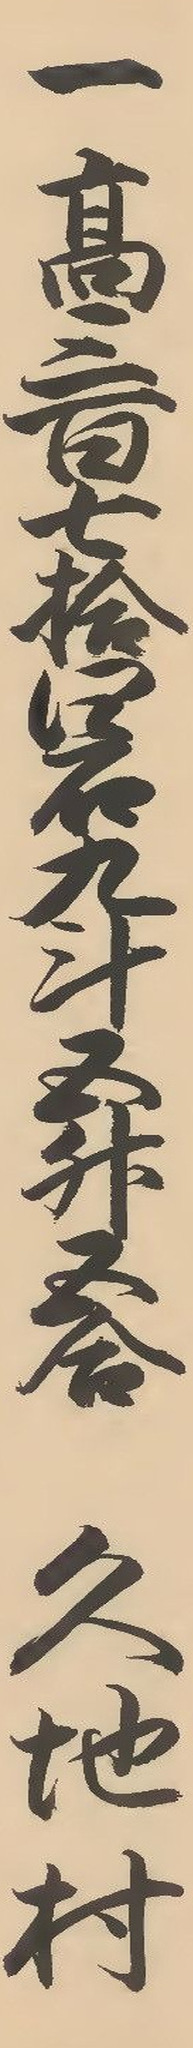一高三百七拾四石九斗五升五合久地村
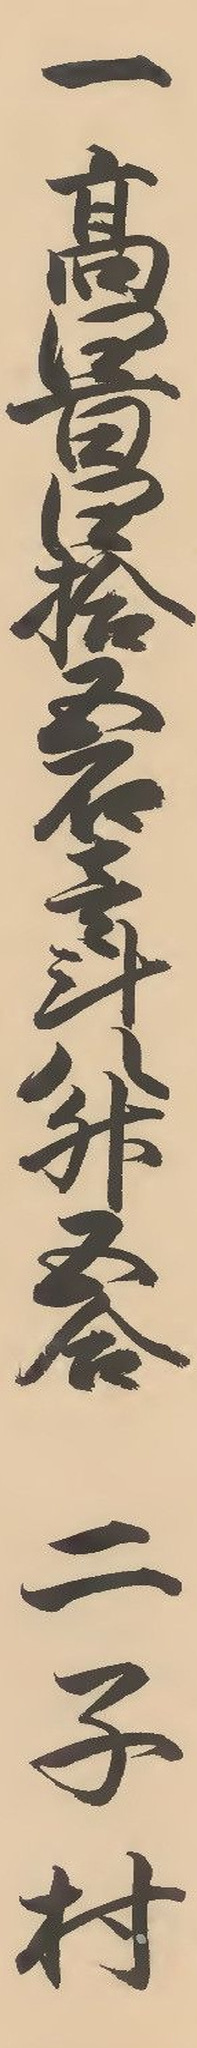一高四百四拾五石壱斗八升五合二子村
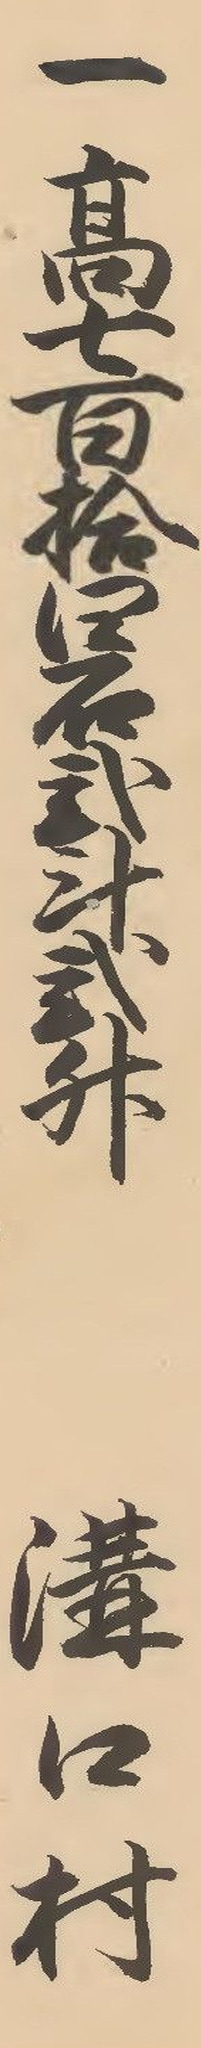一高七百拾四石弐斗弐升溝口村

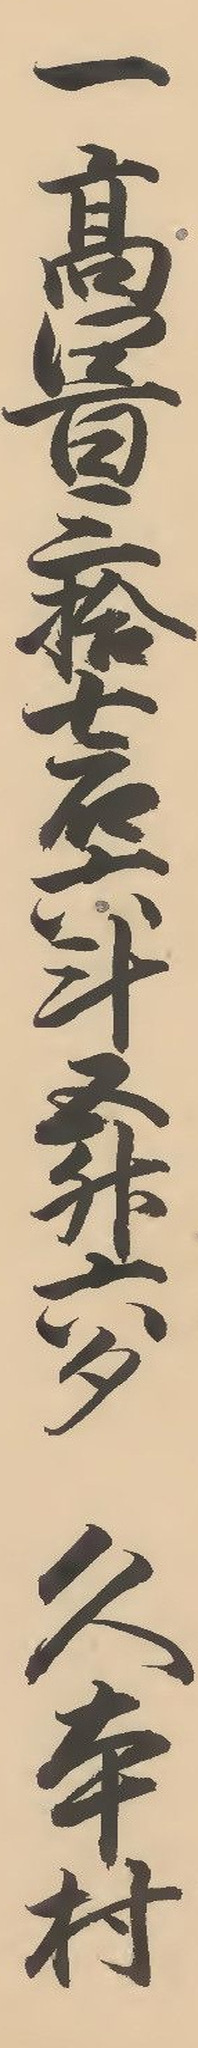一高四百三拾七石六斗五升六勺久本村
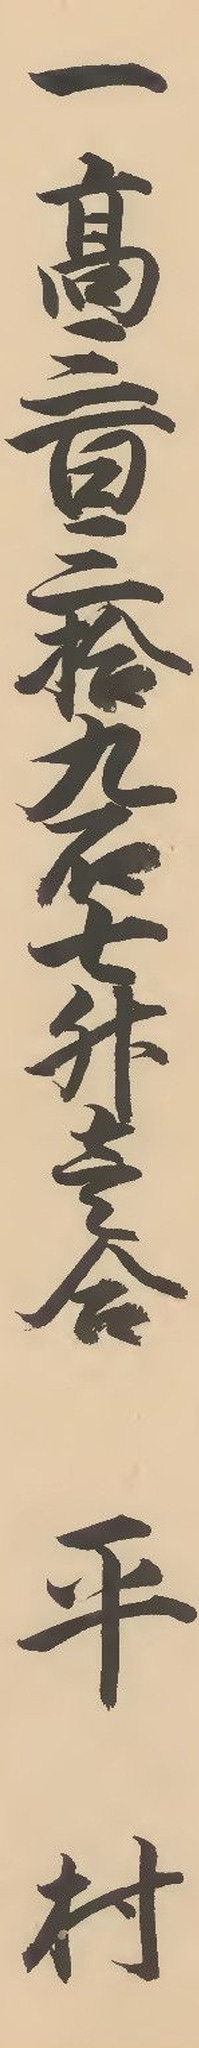一高三百三拾九石七升壱合平村
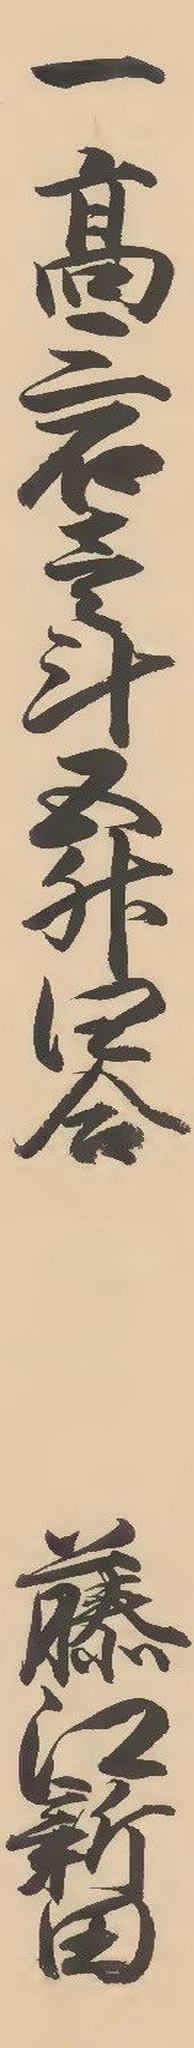一高三石壱斗五升四合藤江新田
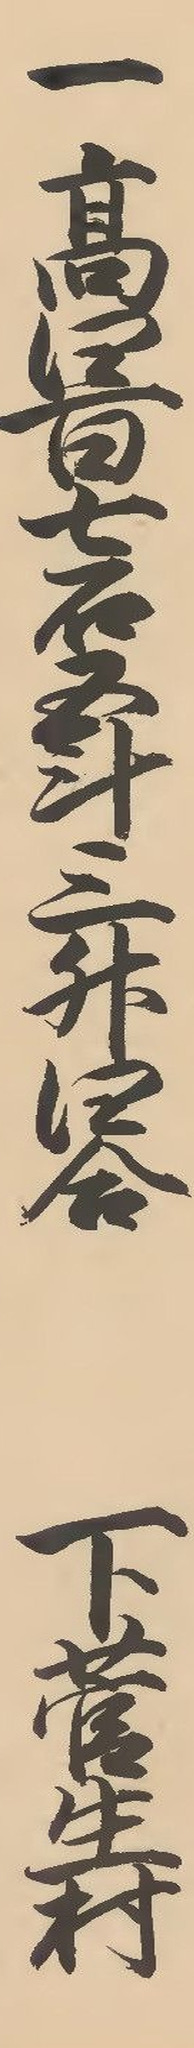一高四百七石五斗三升四合下菅生村
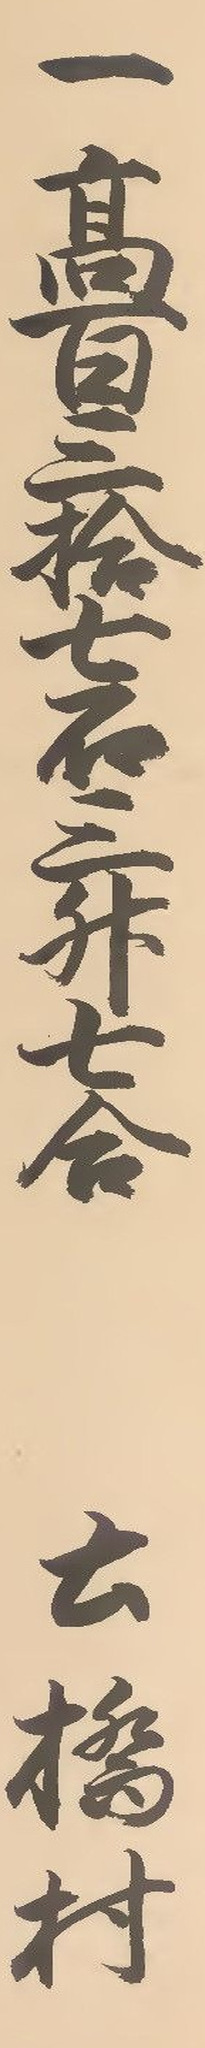一高百三拾七石三升七合土橋村
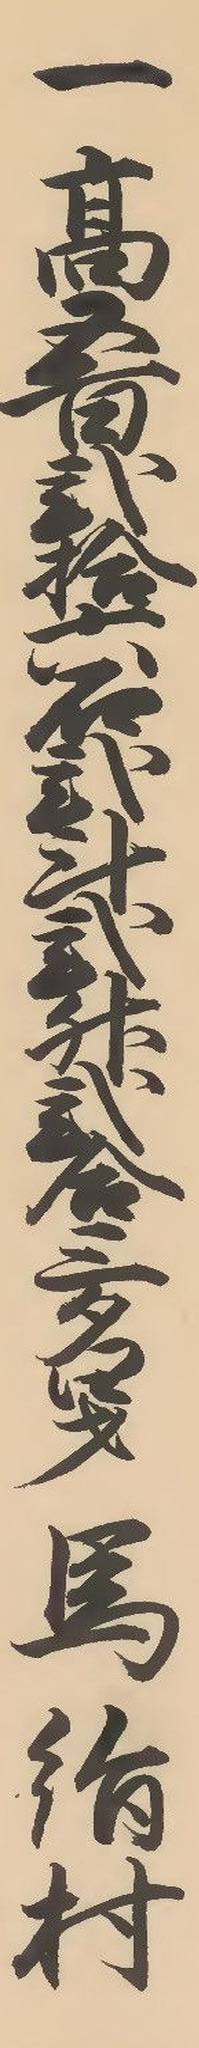一高五百弐拾六石弐斗弐升弐合三勺四才馬絹村
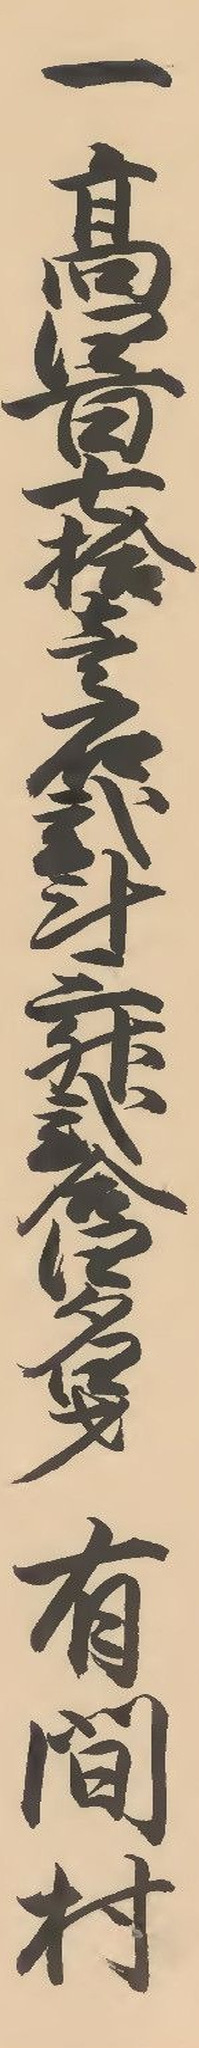一高四百七拾壱石弐斗三升弐合四勺四才有間村
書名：武蔵国郷帳　上
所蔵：国立公文書館 National Archives of Japan
